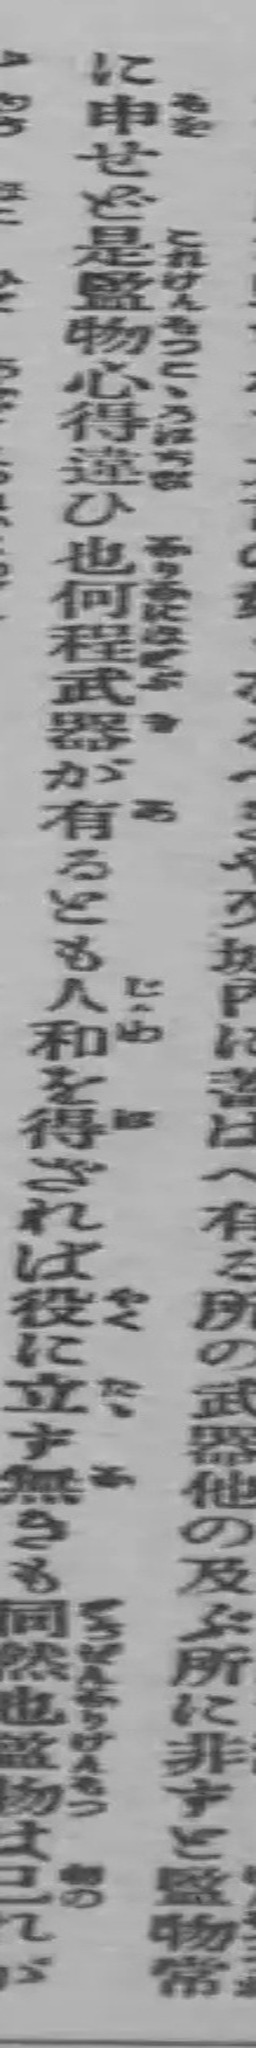に申せど是監物心得違ひ也何程武器が有るとも人和を得ざれば役に立ず無きも同然也監物は巳れが
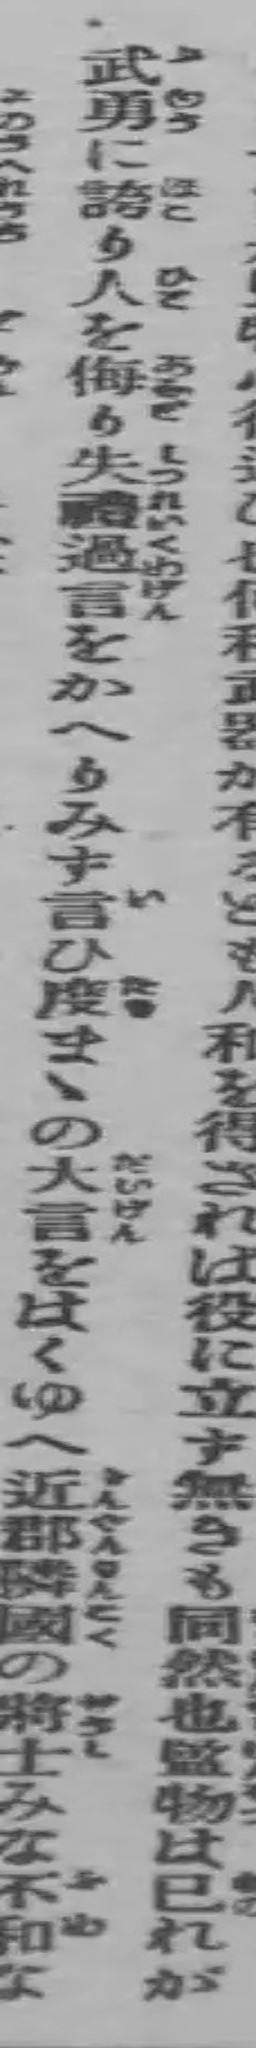武勇に誇り人を侮り失礼過言をかへりみず言ひ度まゝの大言をはくゆへ近郡隣国の将士みな不和な
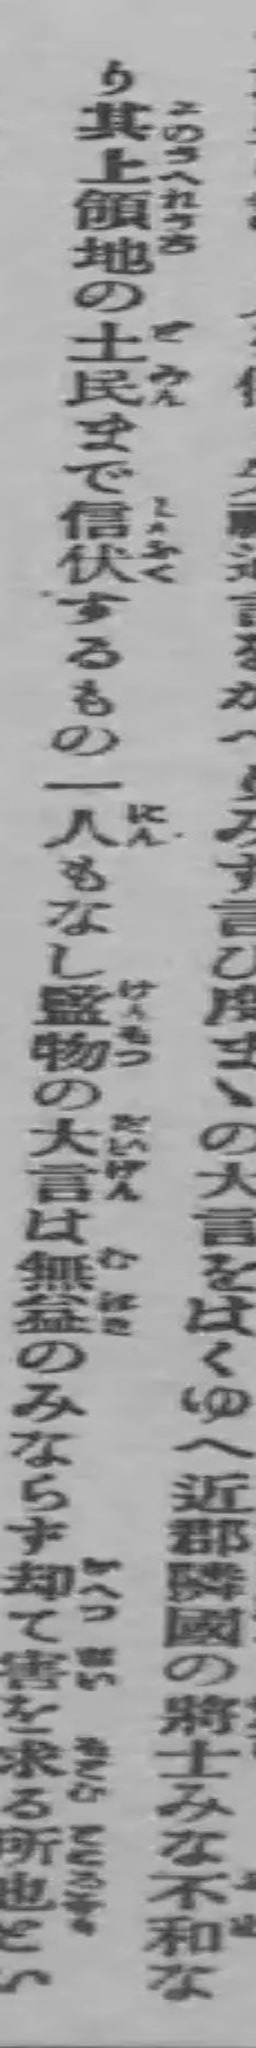り其上領地の土民まで信伏するもの一人もなし監物の大言は無益のみならず却て害を求る所也とい
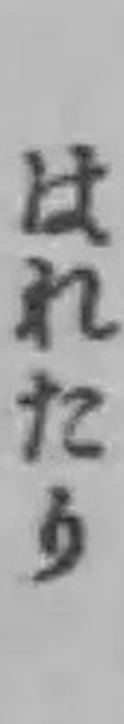はれたり
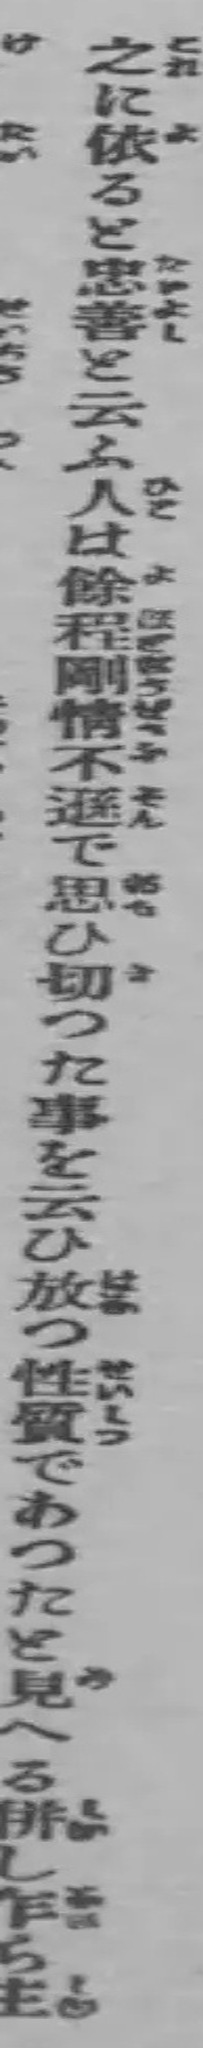之に依ると忠善と云ふ人は余程剛情不遜で思ひ切つた事を云ひ放つ性質であつたと見へる併し乍ら主
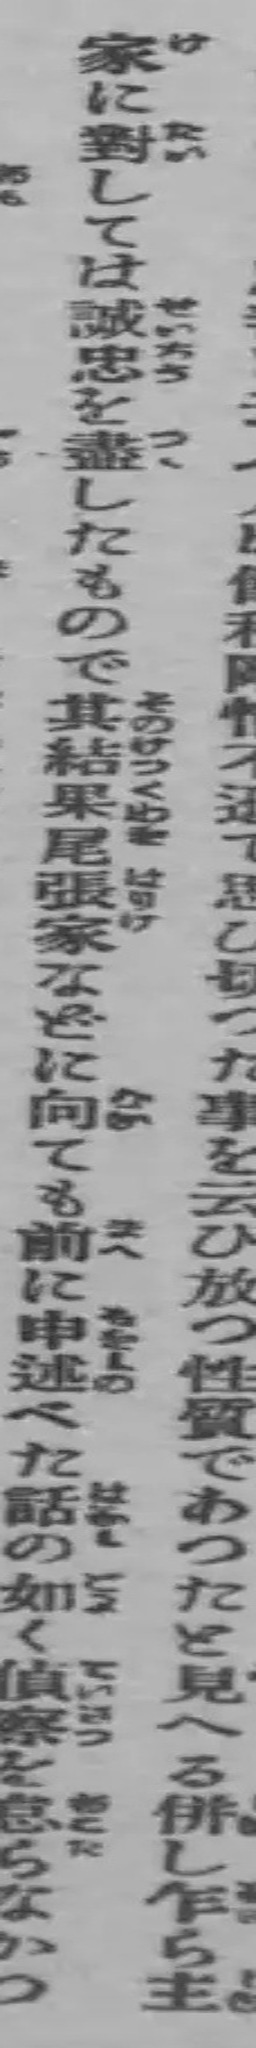家に対しては誠忠を尽したもので其結果尾張家などに向ても前に申述べた話の如く偵察を怠らなかつ
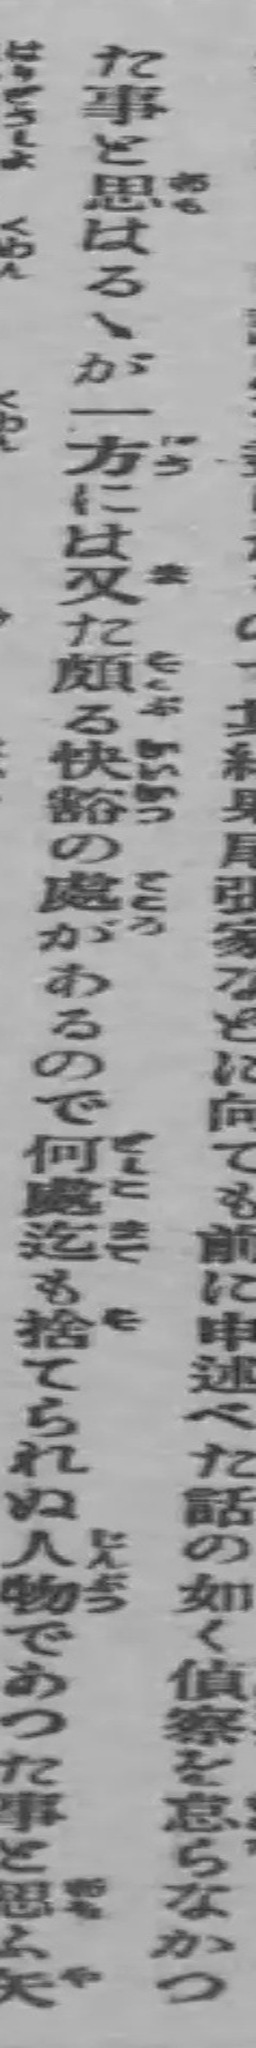た事と思はるゝが一方には又た頗る快豁の処があるので何処迄も捨てられぬ人物であつた事と思ふ矢
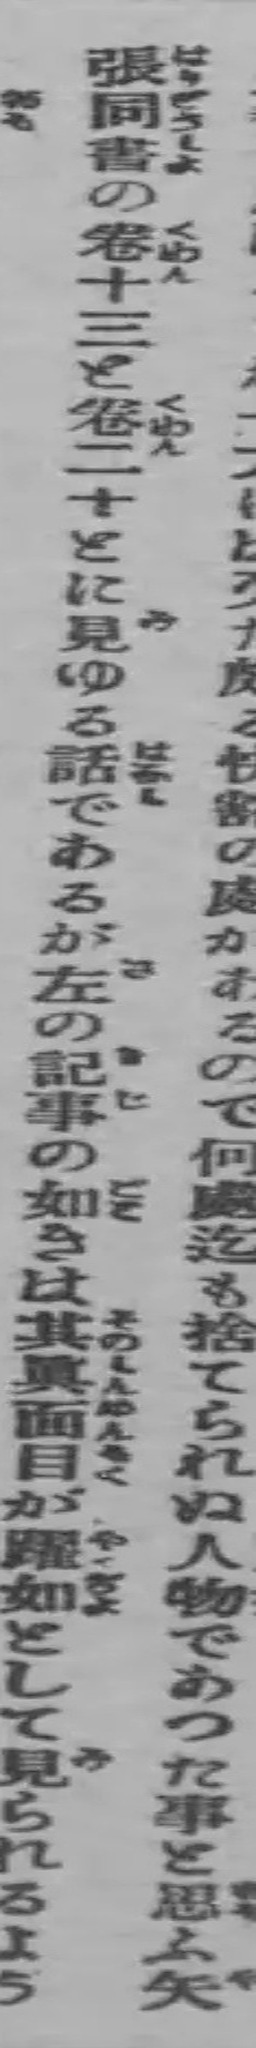張同書の官巻十三と巻二十とに見ゆる話であるが左の記事の如きは其真面目が躍如として見られるよう
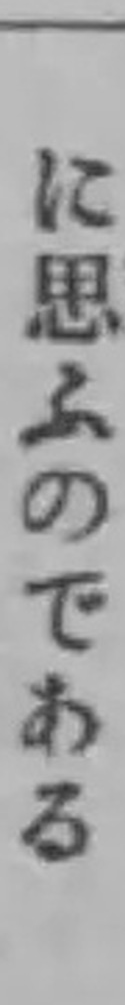に思ふのである
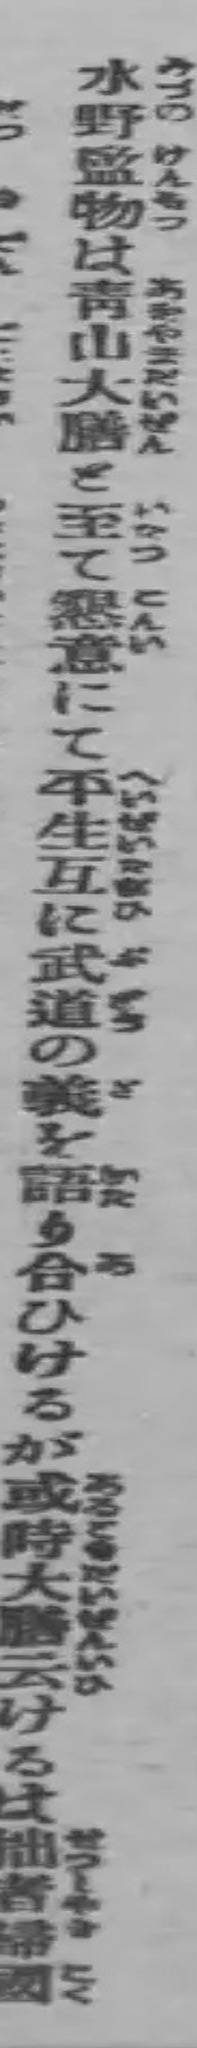水野監物は青山大膳と至て懇意にて平生互に武道の義を語り合ひけるが或時大膳云けるは拙者帰国
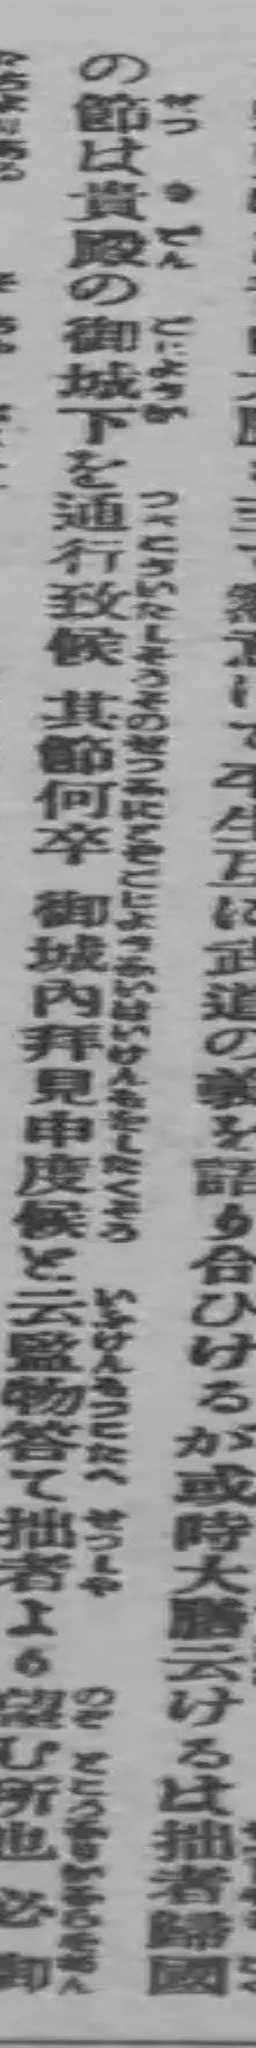の節は貴殿の御城下を通行致候其節何卒御城内拝見申度候と云監物答て拙者より望む所也必御
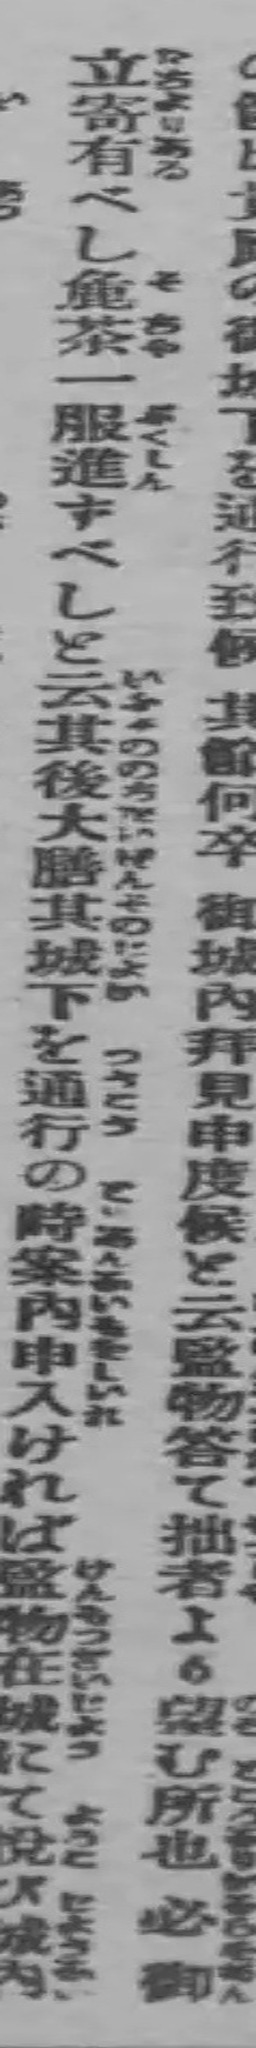立寄有べし麁茶一服進ずべしと云其後大膳其城下を通行の時案内申入けれ監物在城にて悦び城内
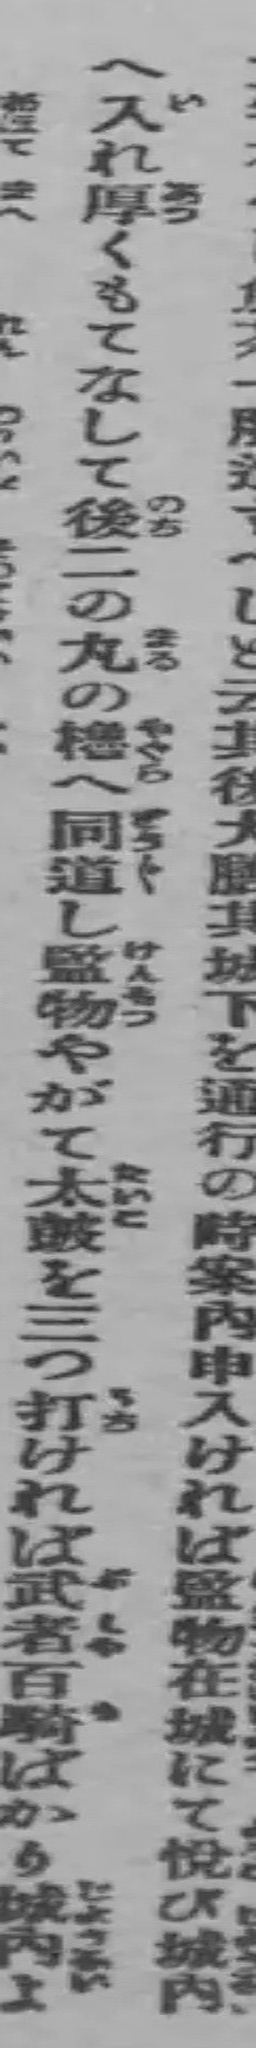へ入れ厚くもてなして後二の丸の櫓へ同道し監物やがて太鼓を三つ打ければ武者百騎ばかり城内よ
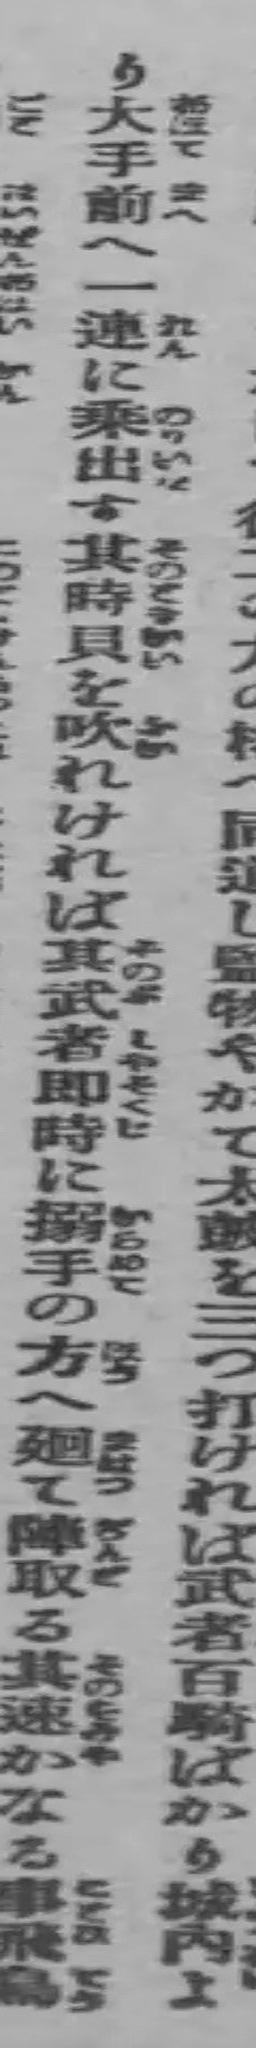り大手前へ一連に乗出す其時貝を吹ければ其武者即時に搦手の方へ廻て陣取る其速かなる事飛鳥
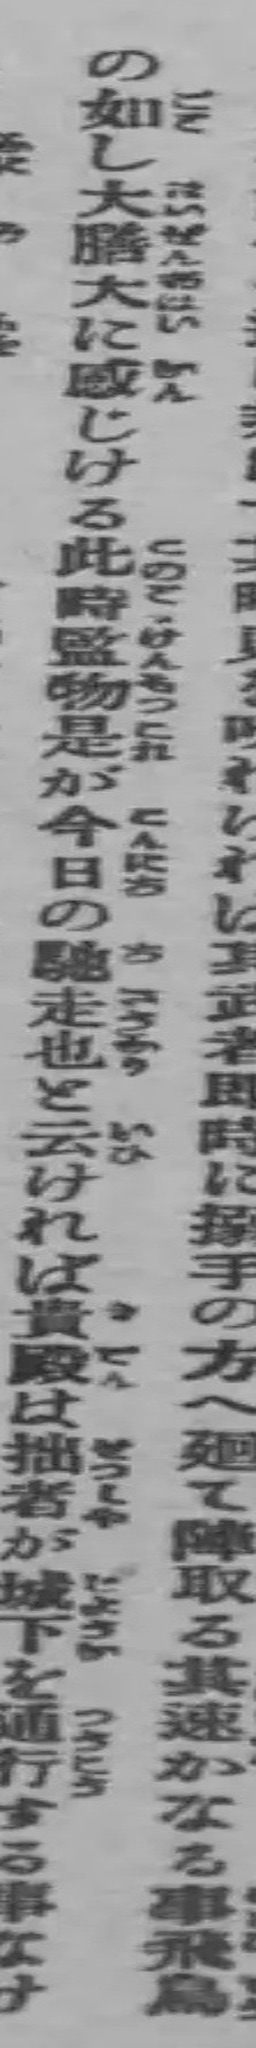の如し大膳大に感じける此時監物是が今日の馳走也と云ければ貴殿は拙者が城下を通行する事なけ
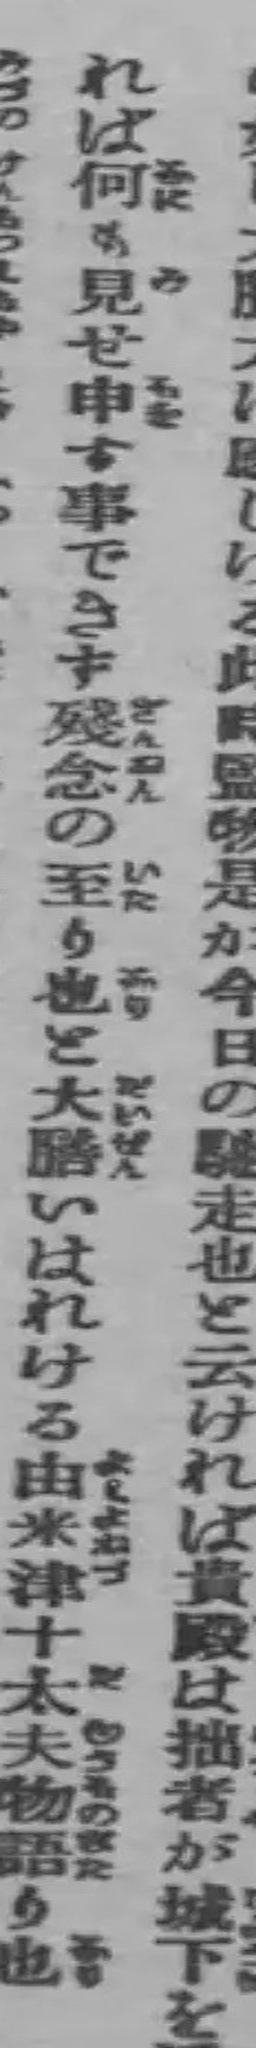れば何も見せ申す事できず残念の至り也と大膳いはれける由米津十太夫物語り也
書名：豊橋市史談
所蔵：国立国会図書館 National Diet Library, JAPAN
